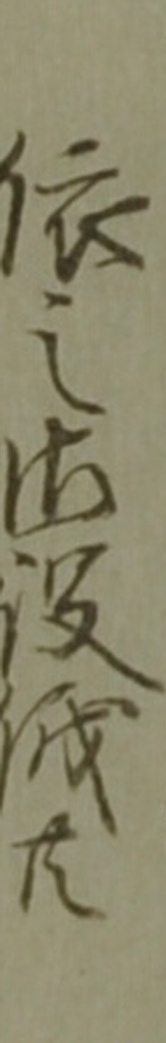依之御役儀共
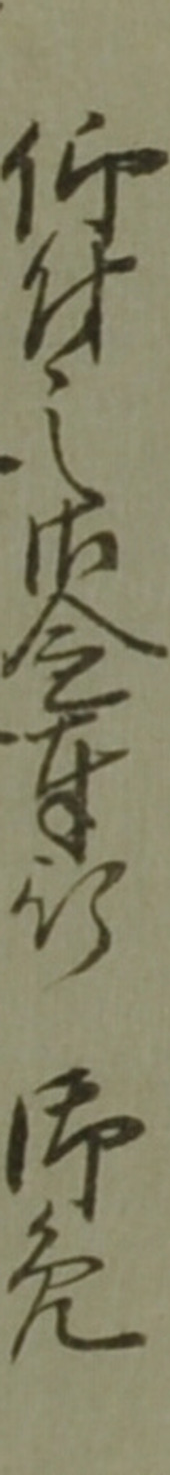仰付之御金奉行御免
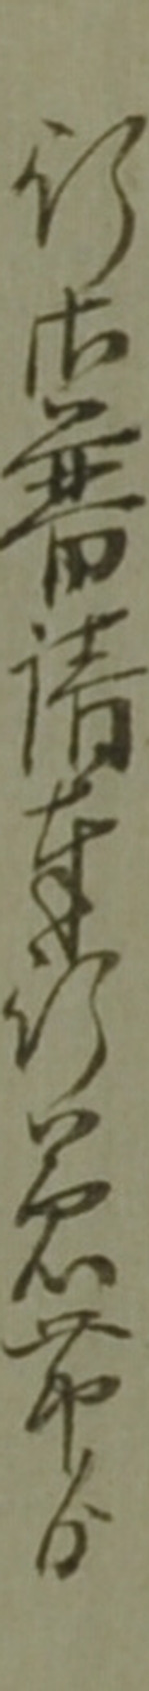行御普請奉行兼帯ゟ
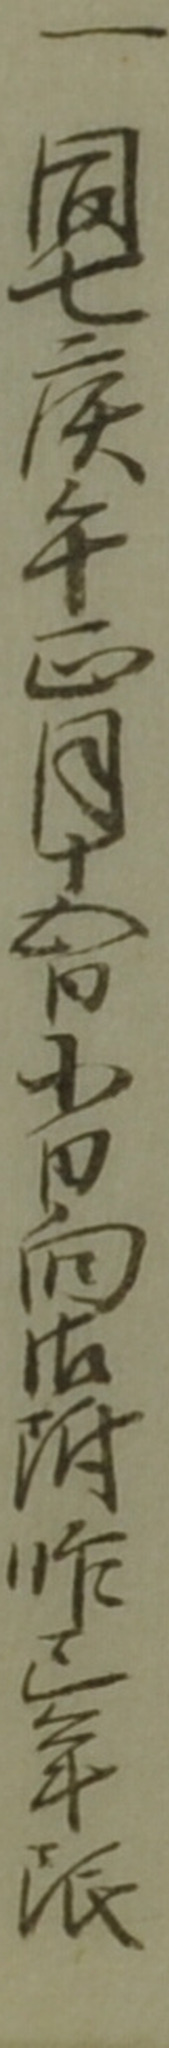一同七庚午正月十五日小日向御附昨三年陙
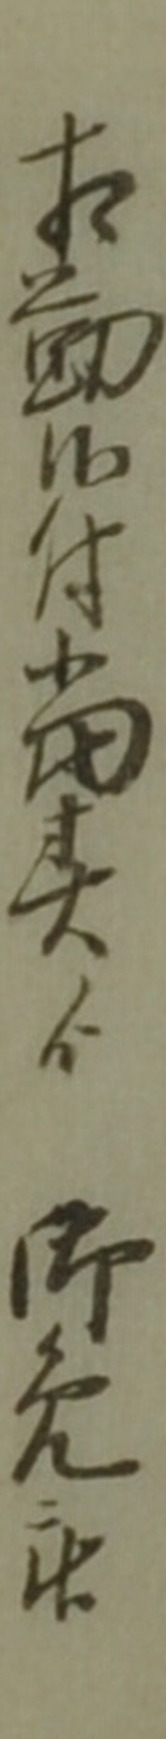相勤仰付当春ゟ御免被
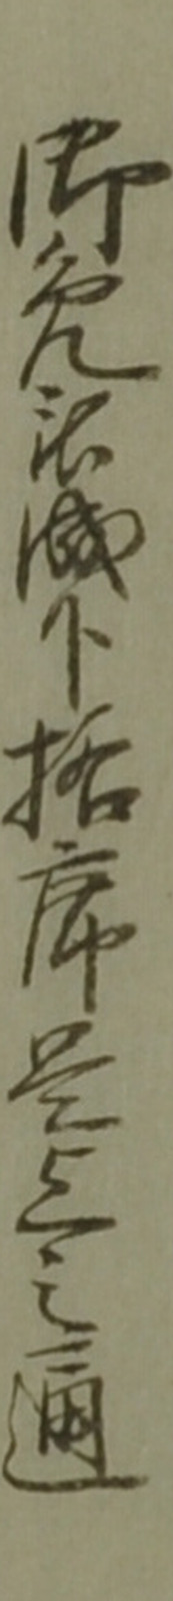御免被成下格席是迄之通
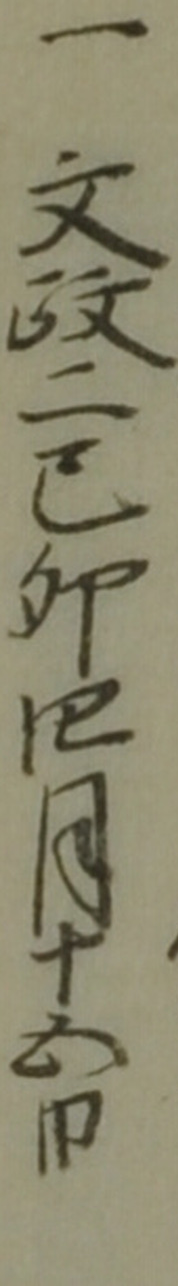一文政二己卯四月十五日
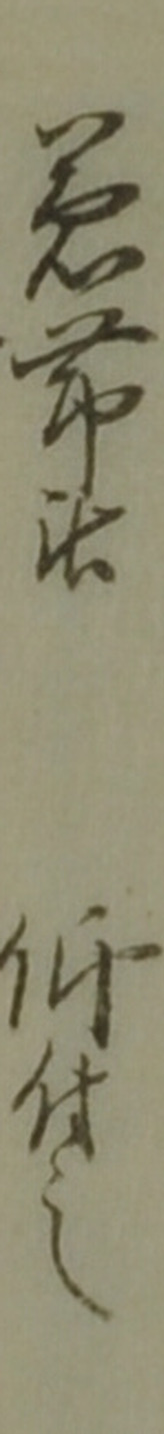兼帯被仰付之
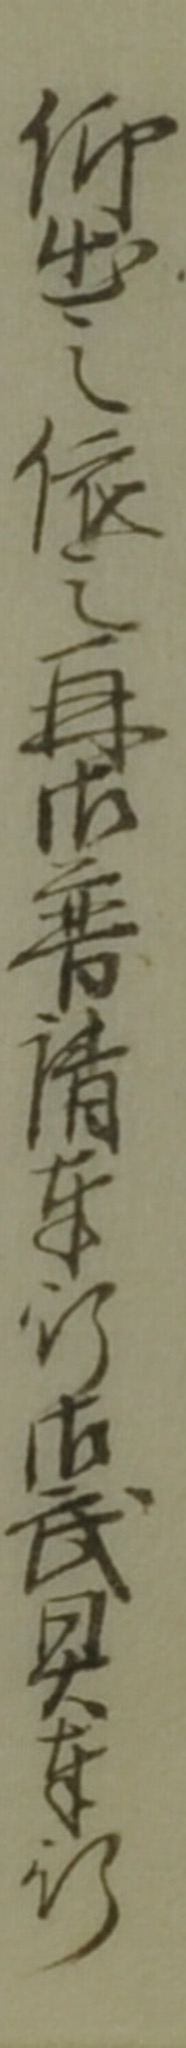仰出之依之再御普請奉行御武具奉行
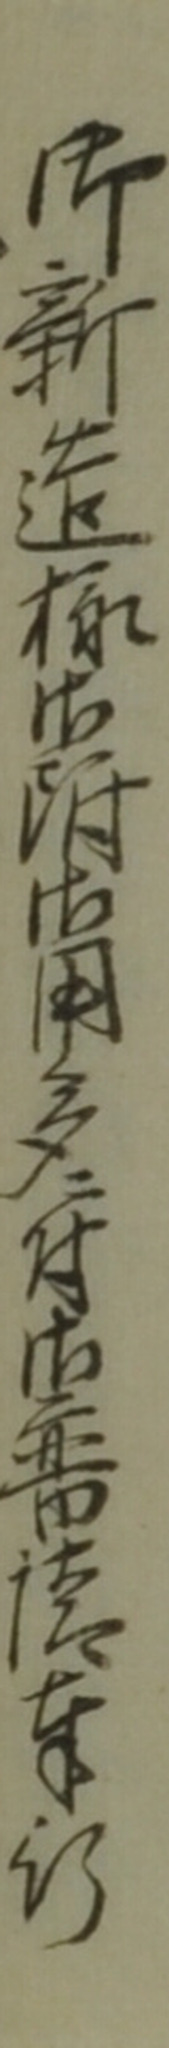御新造様御御新造附御用多ニ付御普請奉行
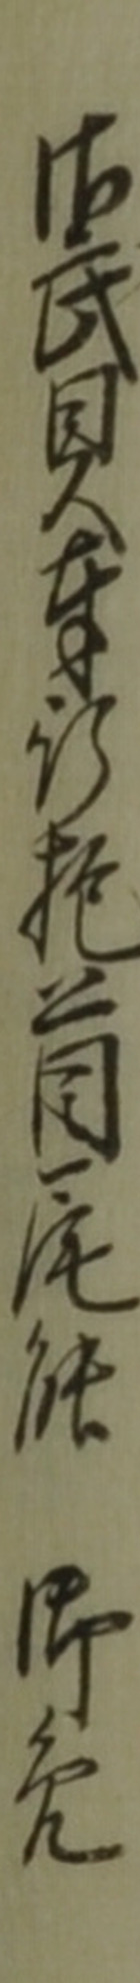御武具奉行抱首尾能御免
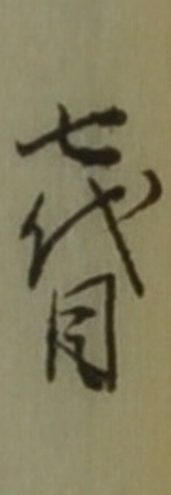七代目
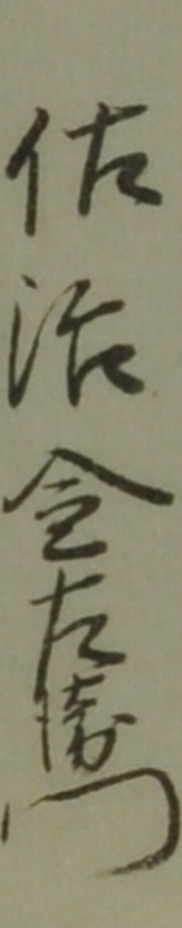佐治金左衛門
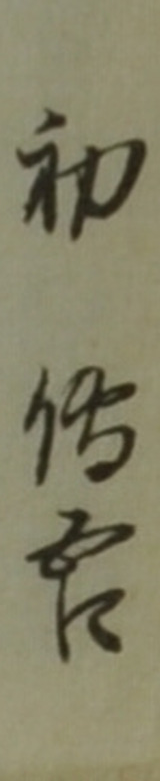初伝吾
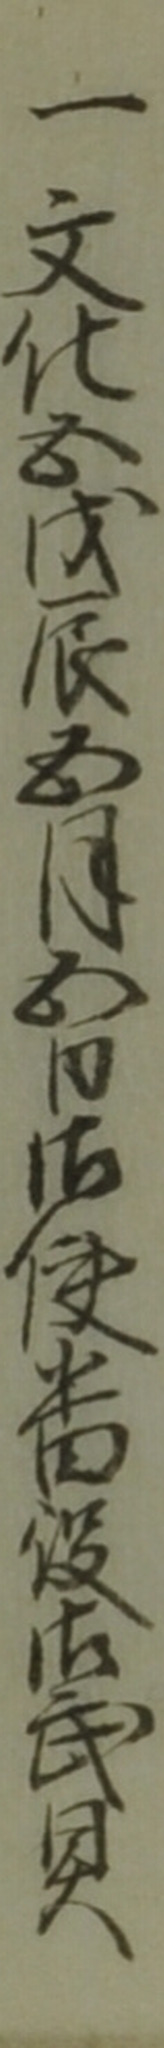一文化五戊辰五月五日御使番役御武具
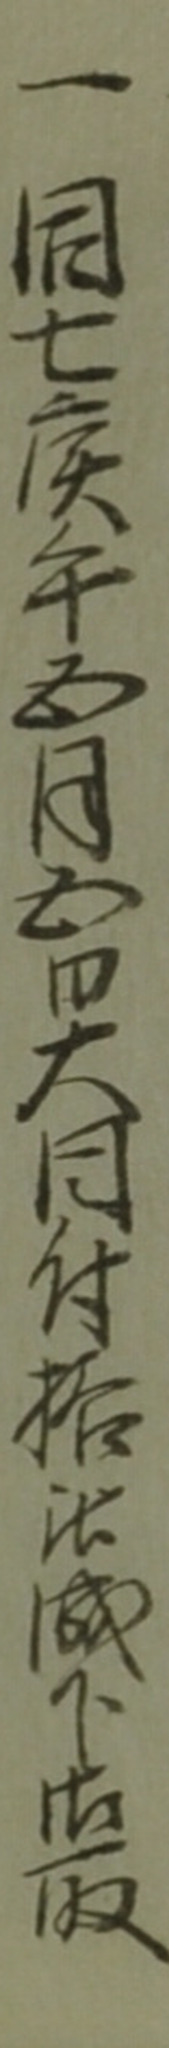一同七庚午五月五日大目付格被成下御取
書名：諸御役代々録（六）
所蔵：伊那市立高遠町図書館・合同会社AMANE
